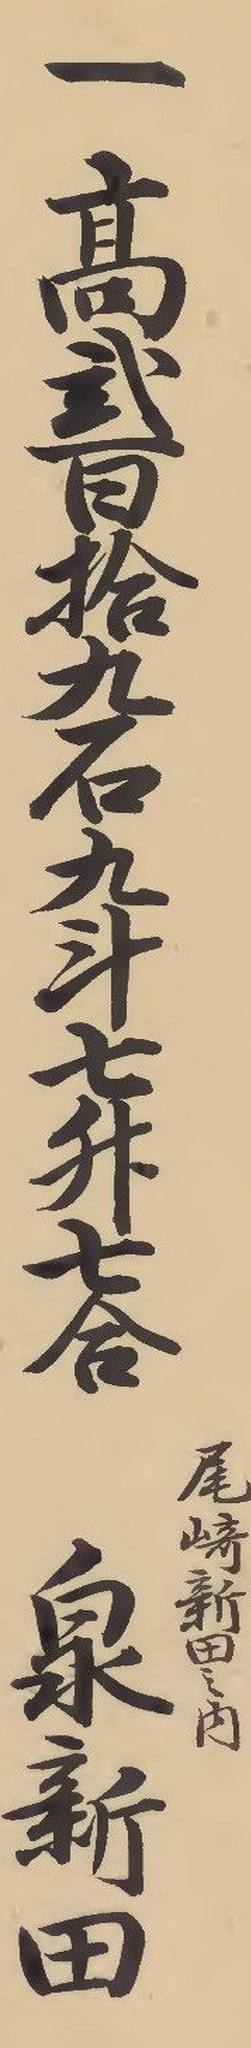一高弐百拾九石九斗七升七合泉新田
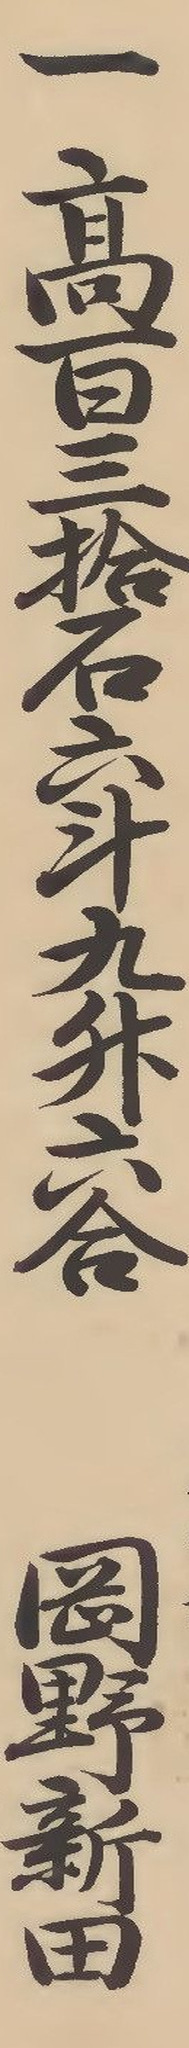一高百三拾石六斗九升六合岡野新田
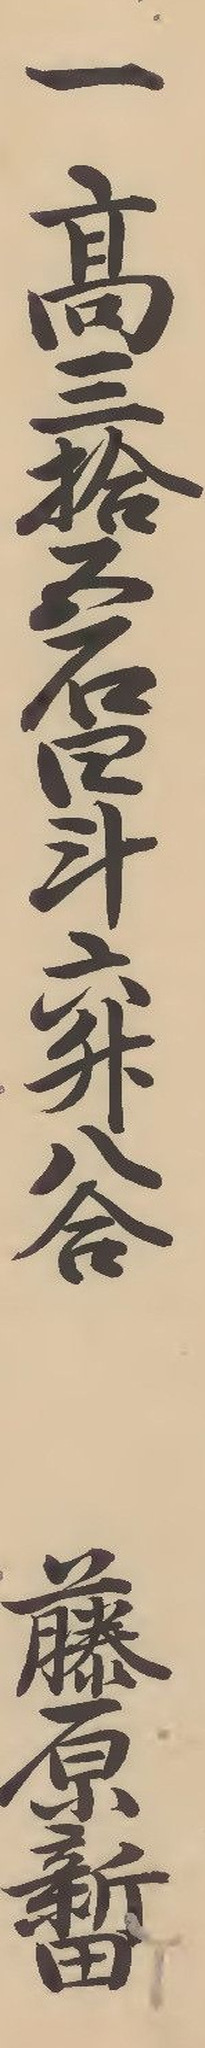一高三拾五石四斗六升八合藤原新田
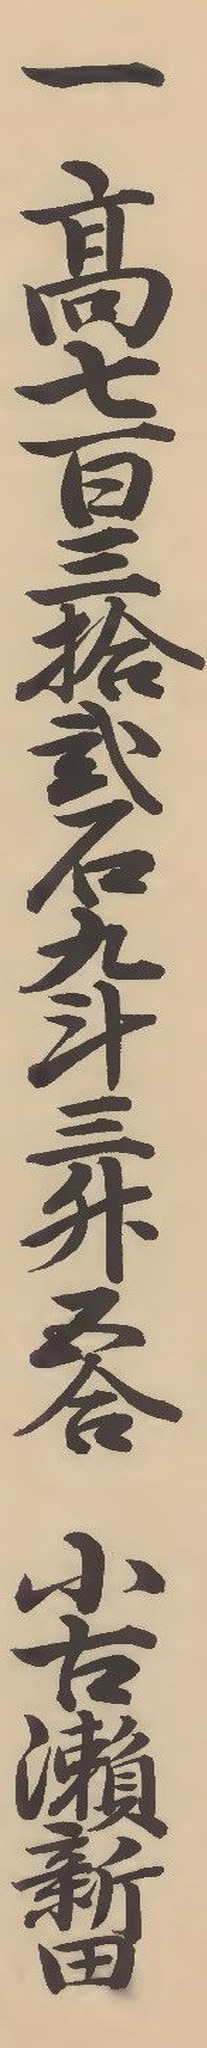一高七百三拾弐石九斗三升五合小古瀬新田
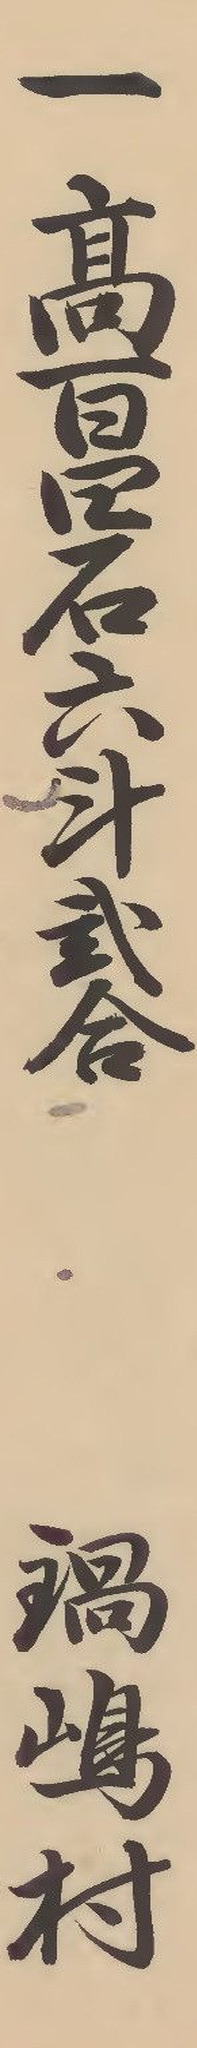一高百四石六斗弐合鍋島村

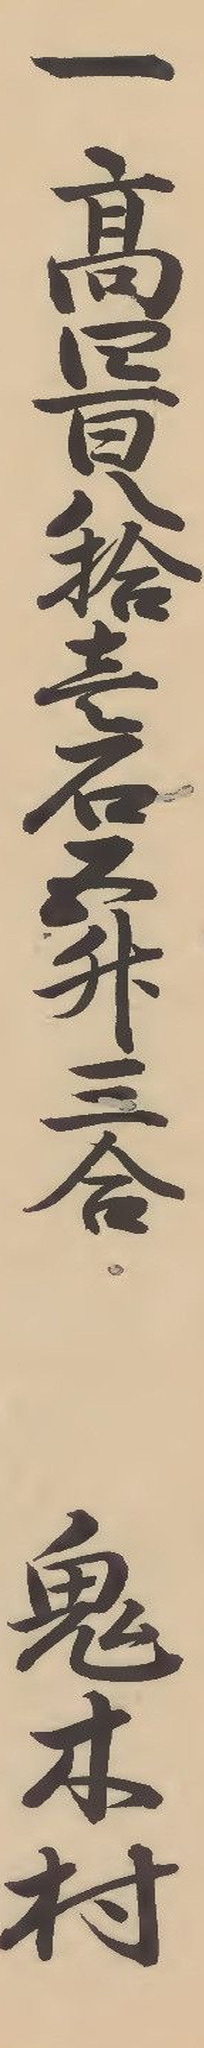一高四百八拾壱石五升三合鬼木村
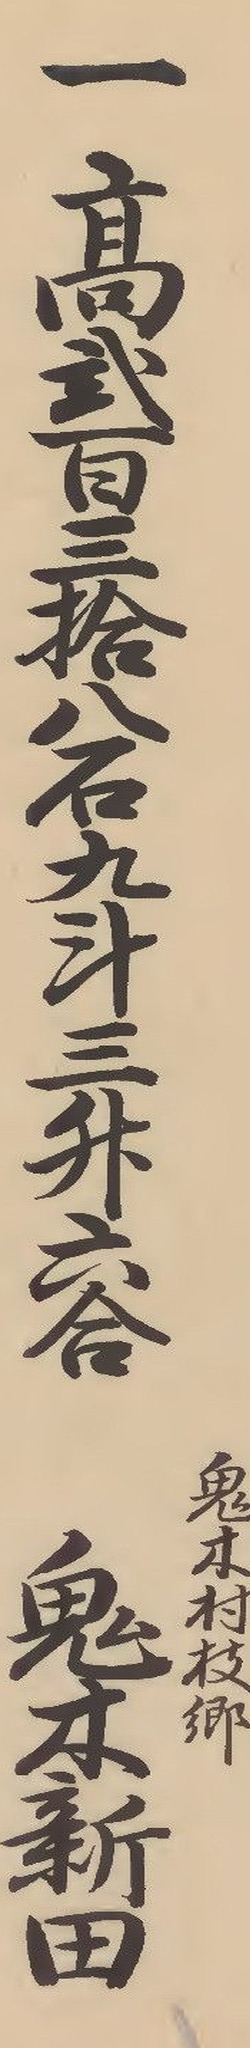一高弐百三拾八石九斗三升六合鬼木新田
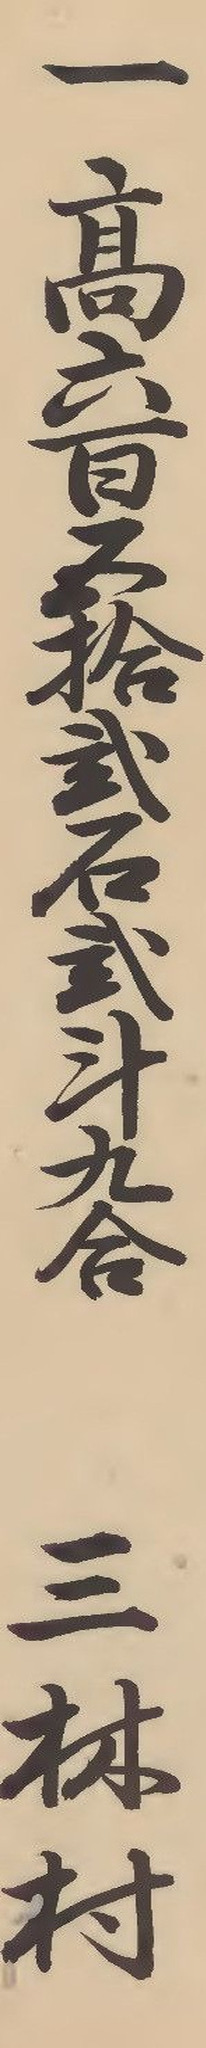一高六百五拾弐石弐斗九合三林村
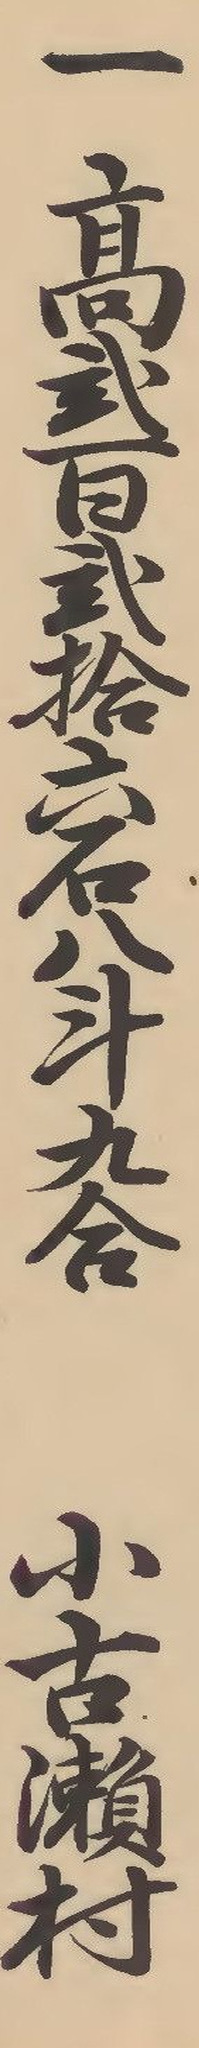一高弐百弐拾六石八斗九合小古瀬村
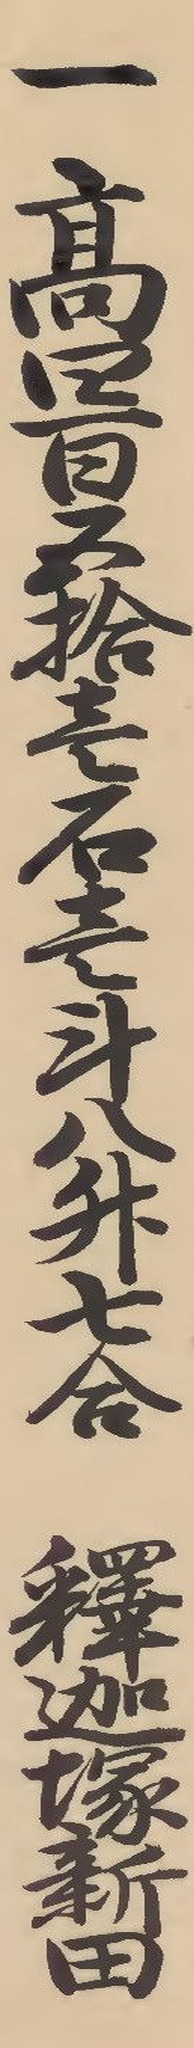一高四百五拾壱石壱斗八升七合釈迦塚新田
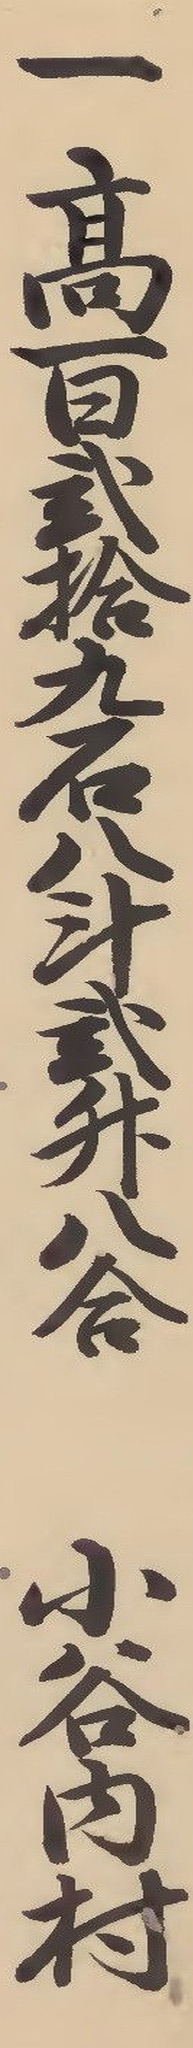一高百弐拾九石八斗弐升八合小谷内村
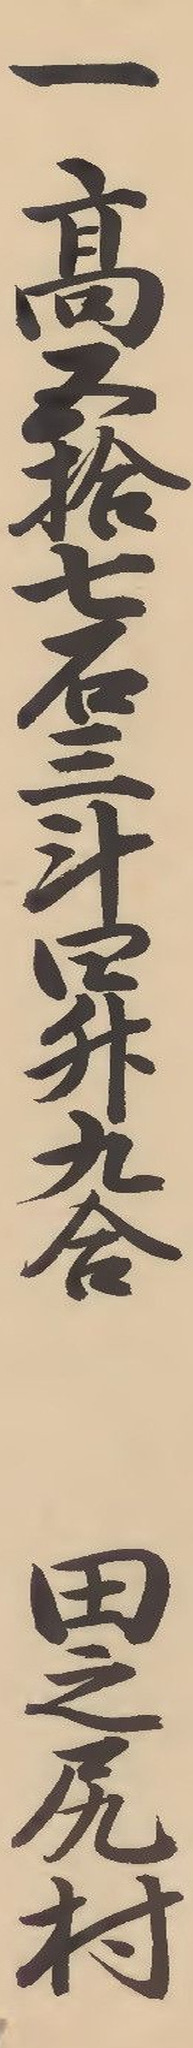一高五拾七石三斗四升九合田之尻村
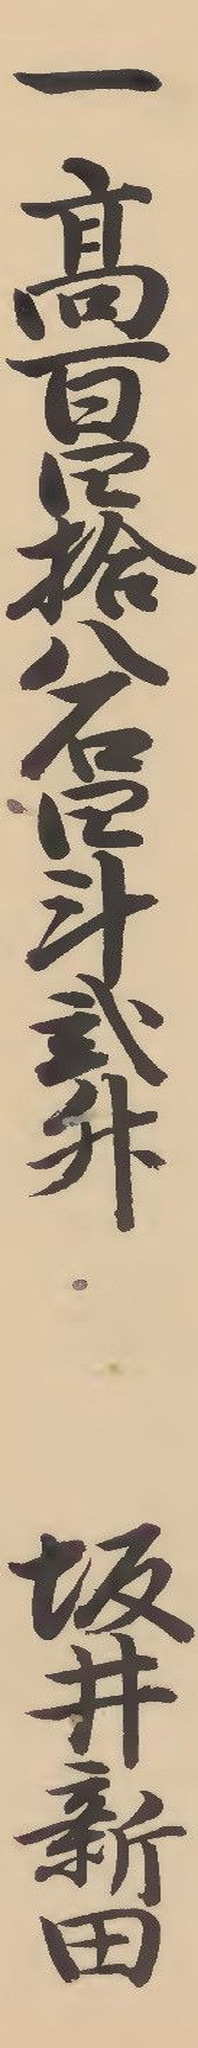一高百四拾八石四斗弐升坂井新田

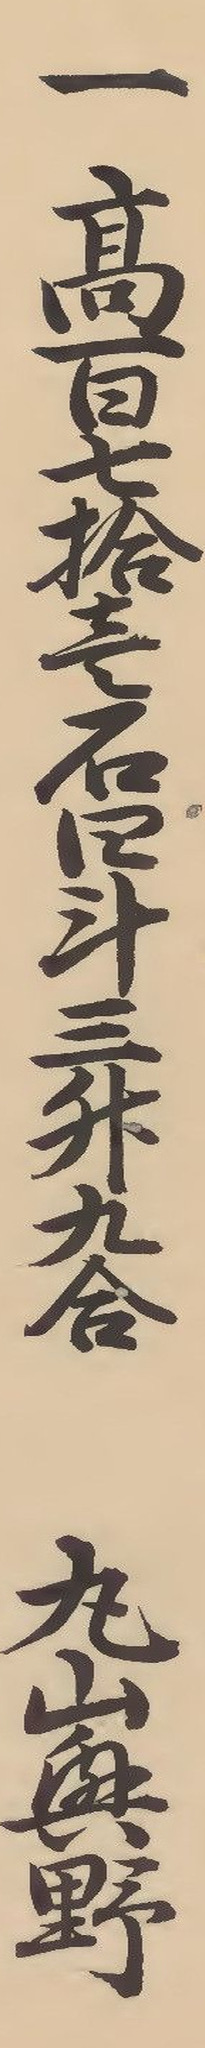一高百七拾壱石四斗三升九合丸山興野
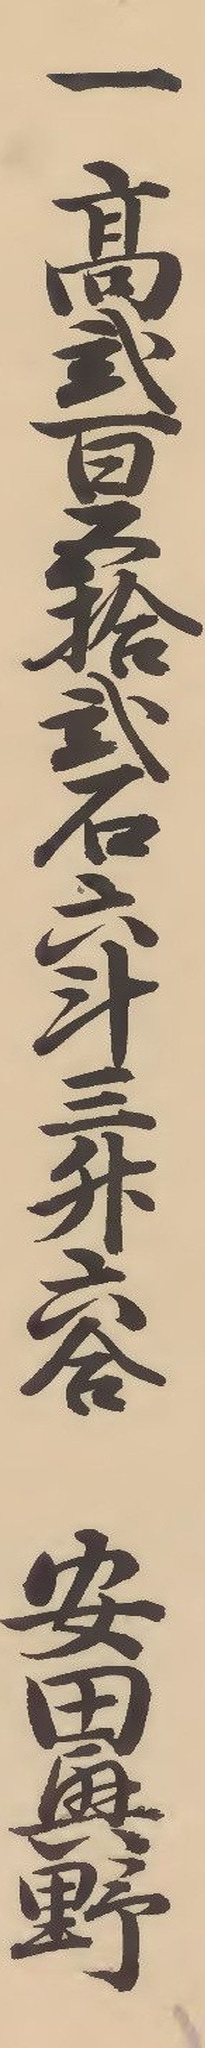一高弐百五拾弐石六斗三升六合安田興野
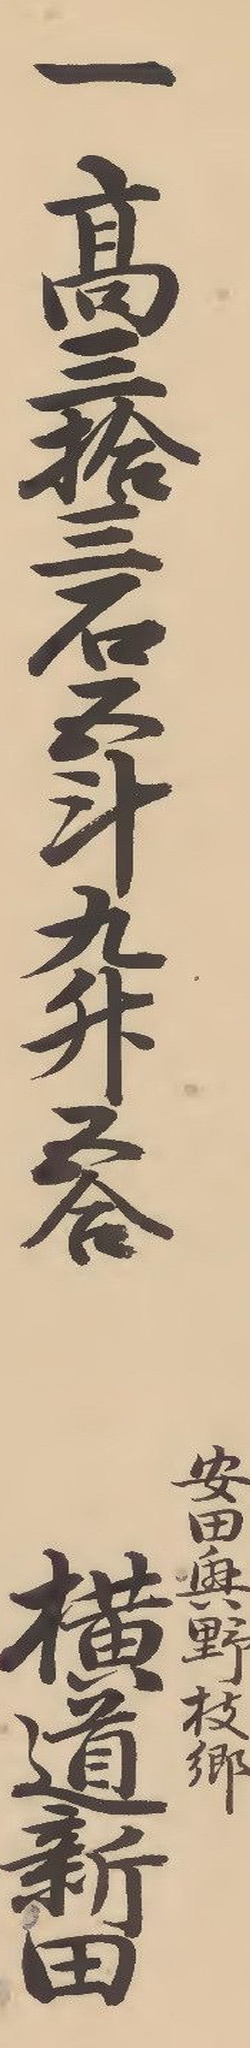一高三拾三石五斗九升五合横道新田
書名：越後国郷帳　下
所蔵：国立公文書館 National Archives of Japan
